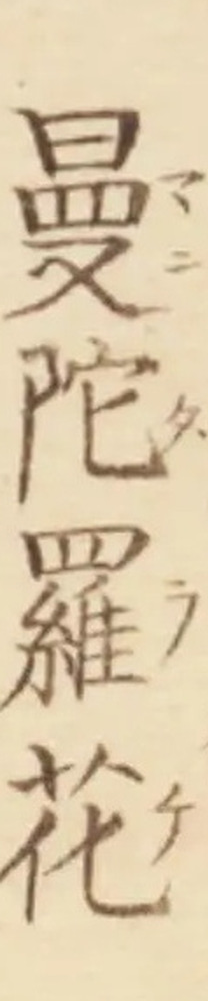曼陀羅花
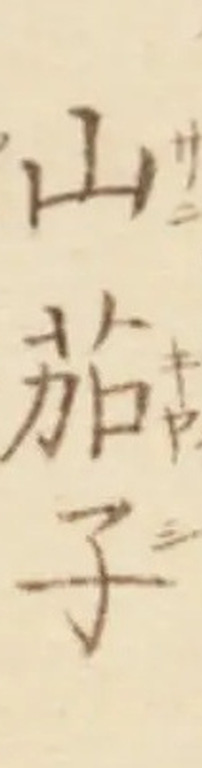山茄子
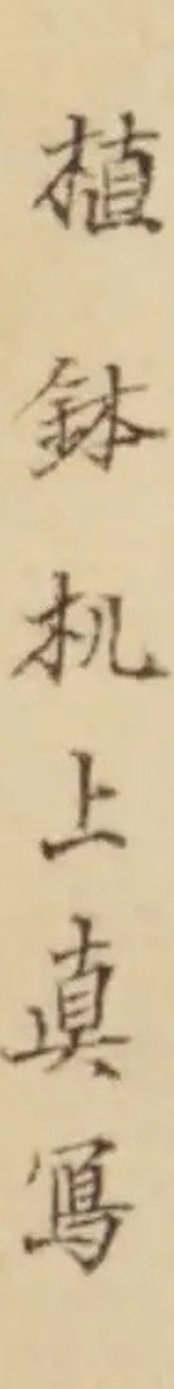植鉢机上真写

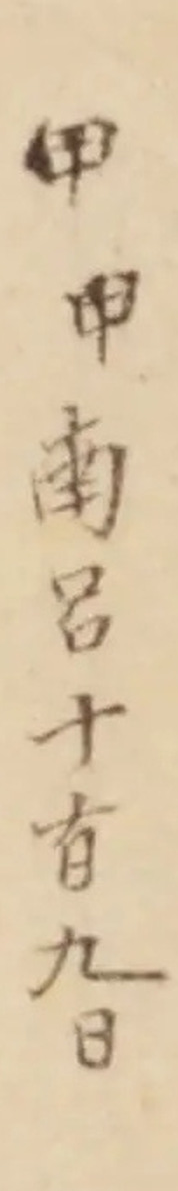甲甲南呂十有九日
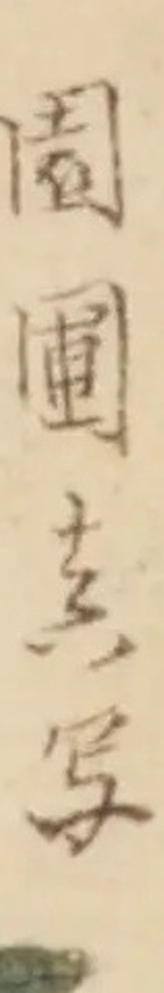園圃真写
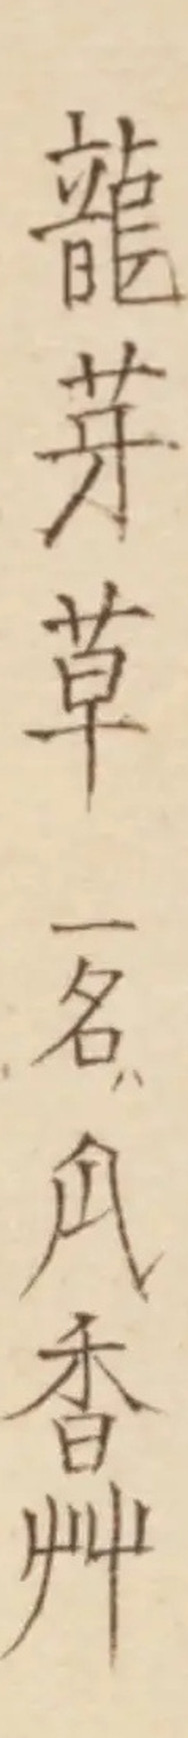竜芽草一名瓜香艸

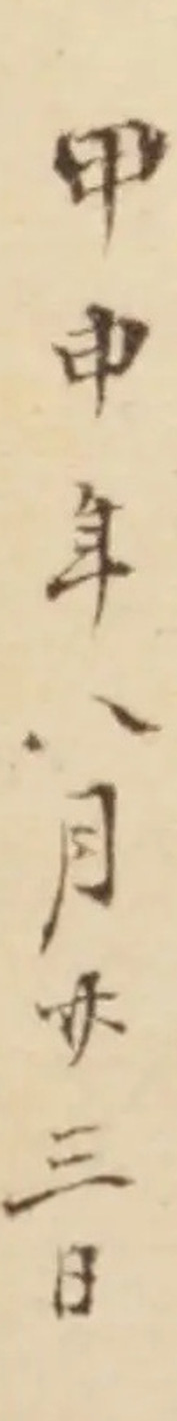甲申年八月廿三日
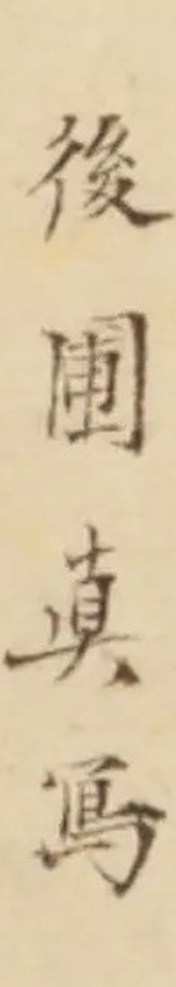後圃真写

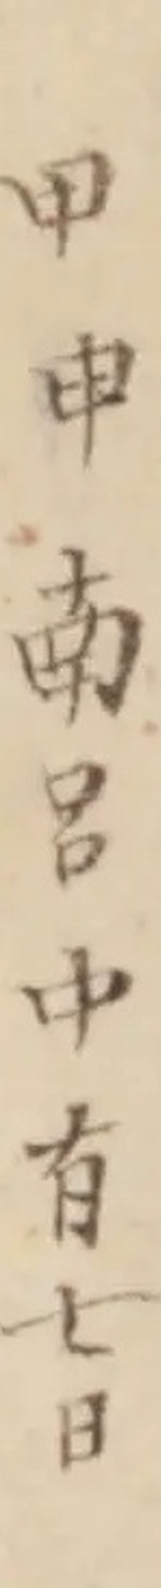甲申南呂中有七日
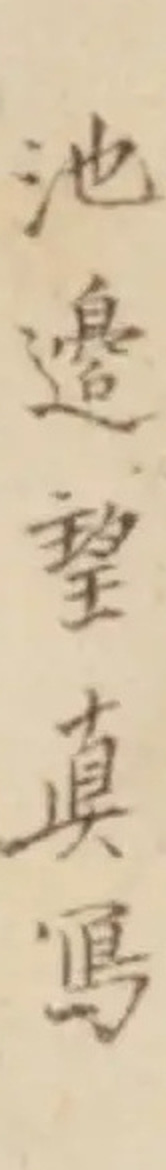池辺望真写
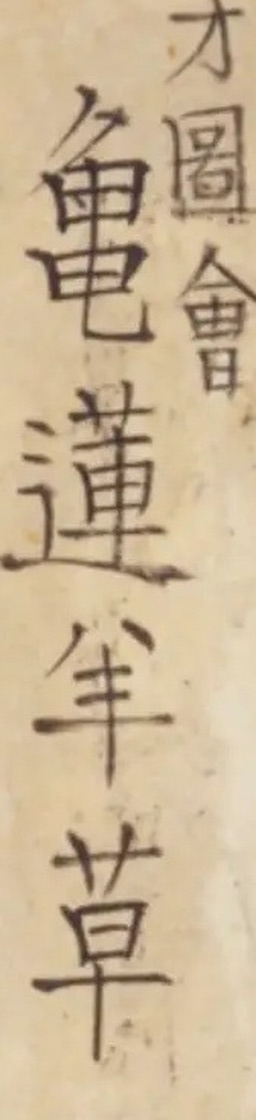亀蓮羊草
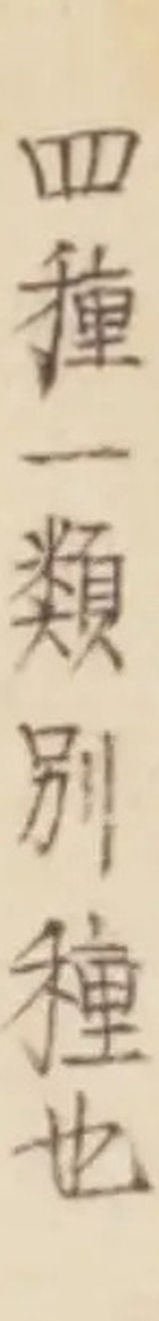四種一類別種也
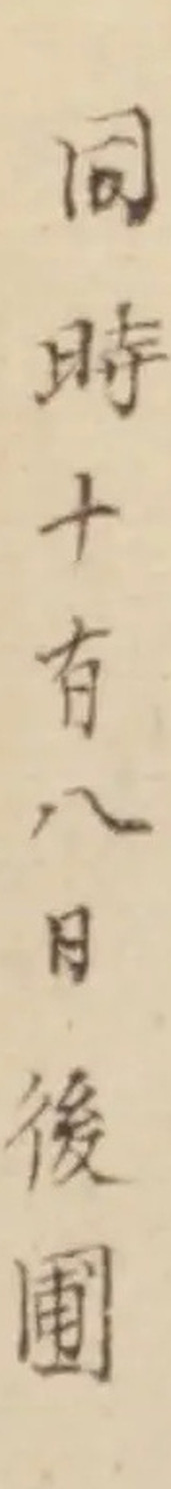同時十有八日後圃
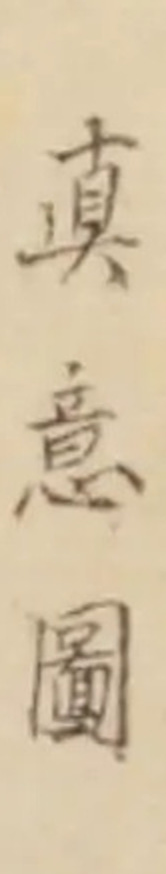真意図

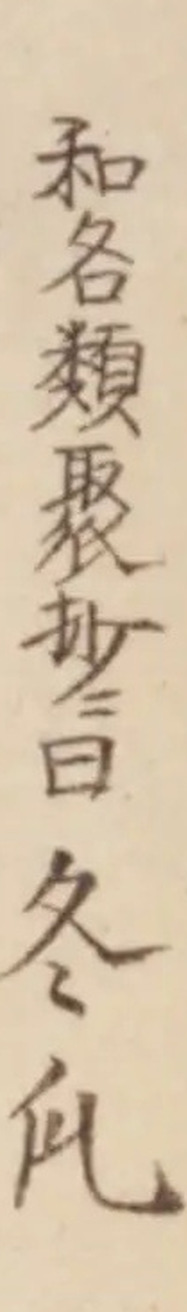和名類聚抄曰冬瓜
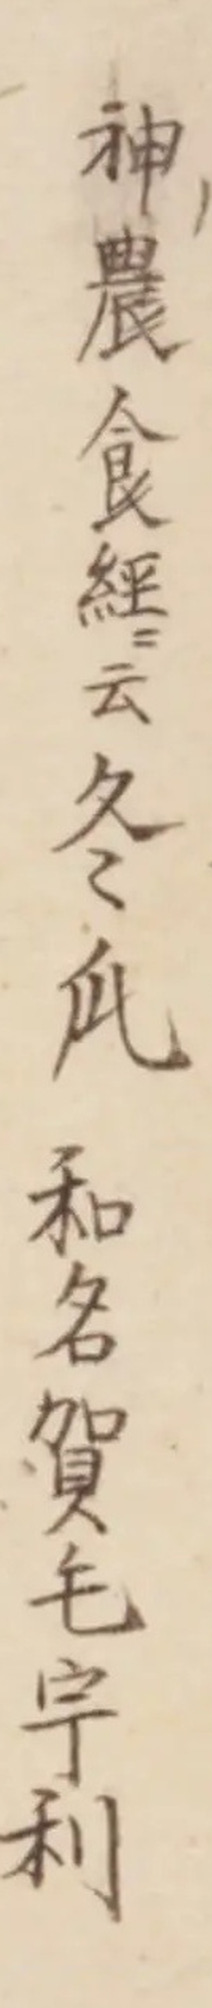神-農食経云冬瓜和名賀毛宇利
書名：梅園草木花譜秋之部. 2
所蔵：国立国会図書館 National Diet Library, JAPAN
